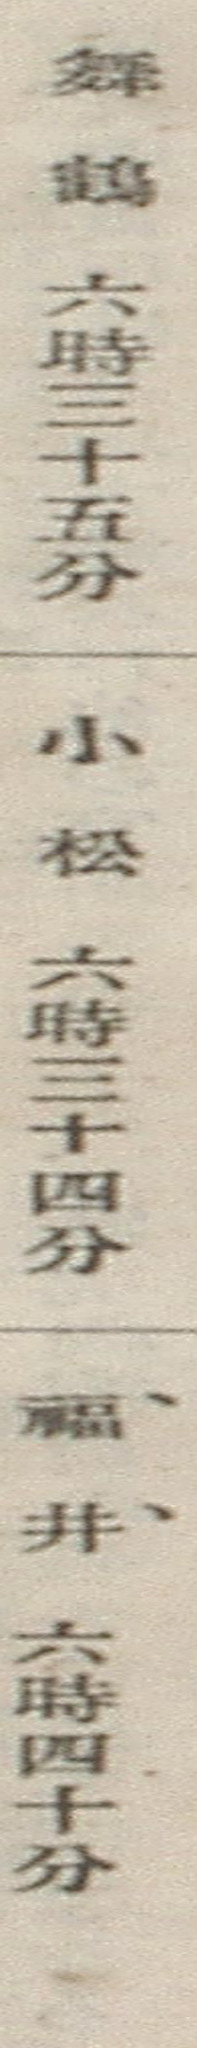舞鶴六時三十五分小松六時三十四分福井六時四十分
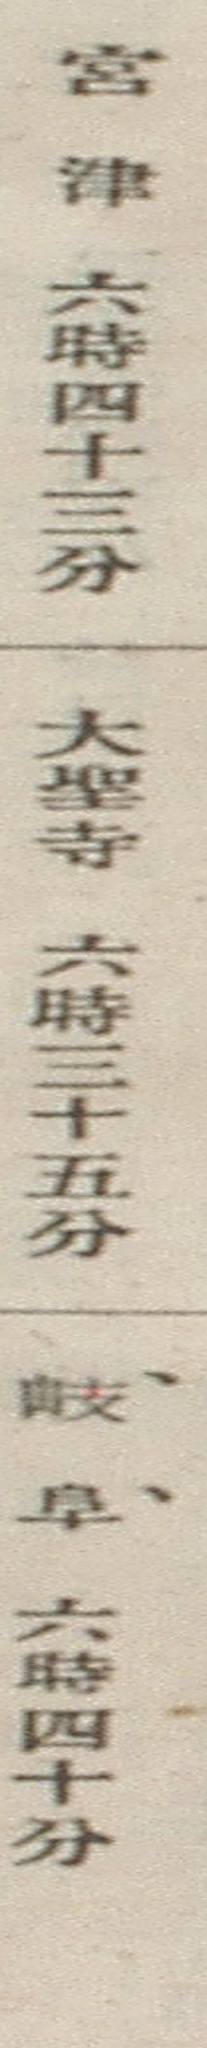宮津六時四十三分大聖寺六時三十五分岐阜六時四十分
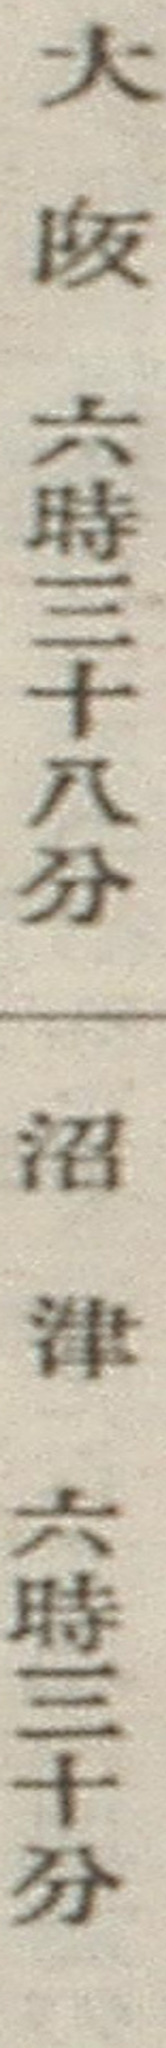兵庫六時四十分松本六時三十分
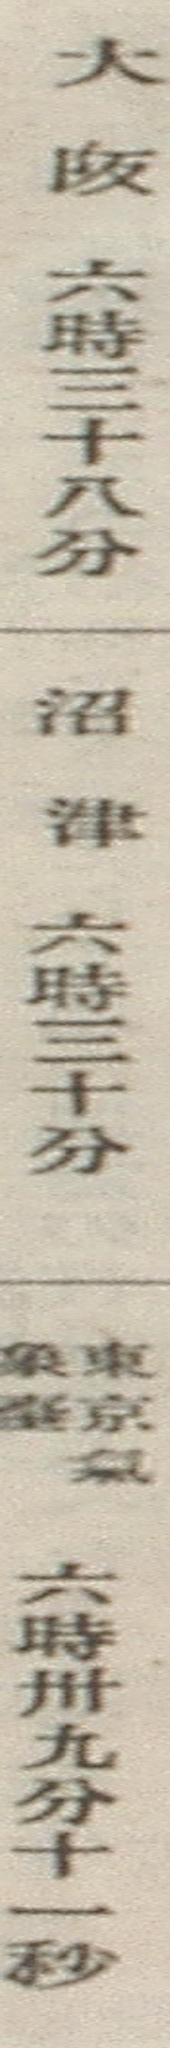大阪六時三十八分沼津六時三十分東京気象台六時卅九分十一秒
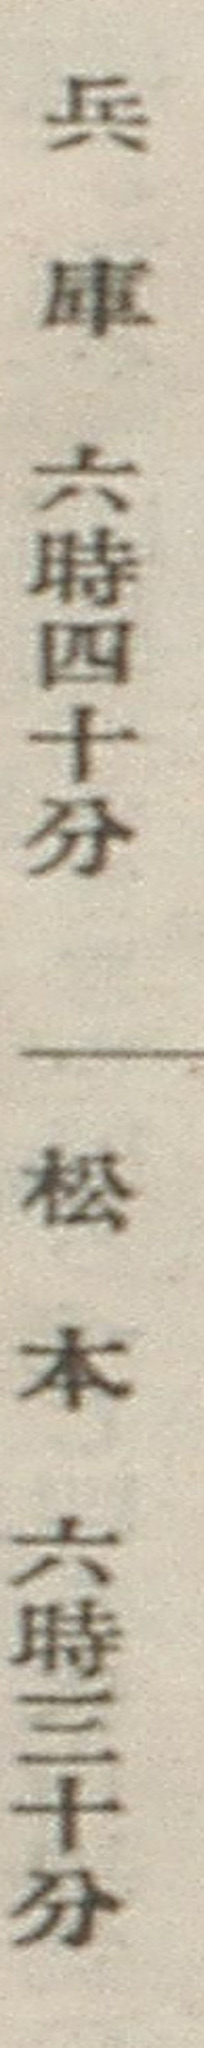兵庫六時四十分松本六時三十分
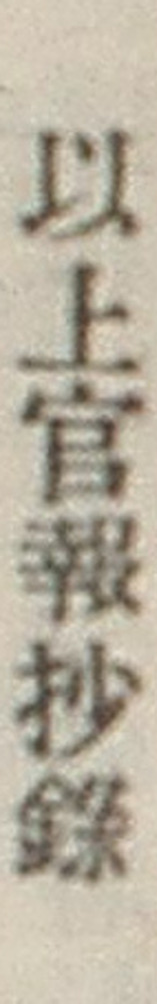以上官報抄録

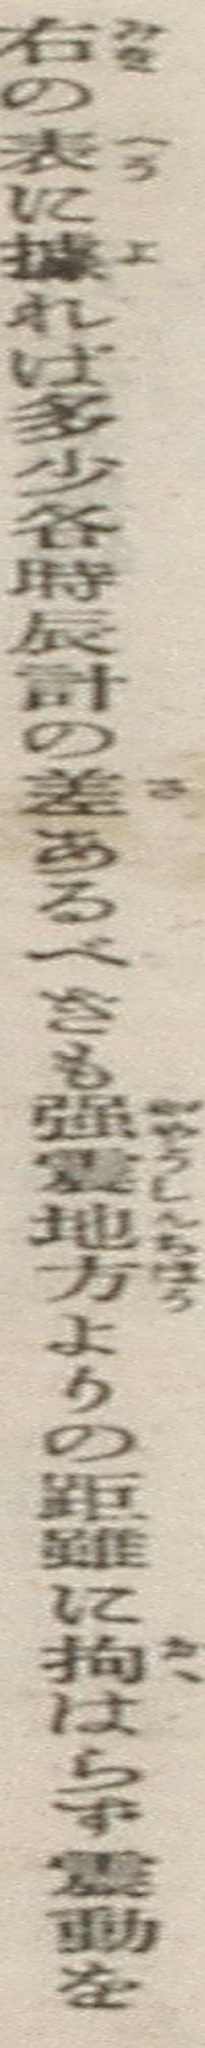右の表に據れば多少各時辰計の差あるべきも強震地方よりの距離に拘はらず震動を
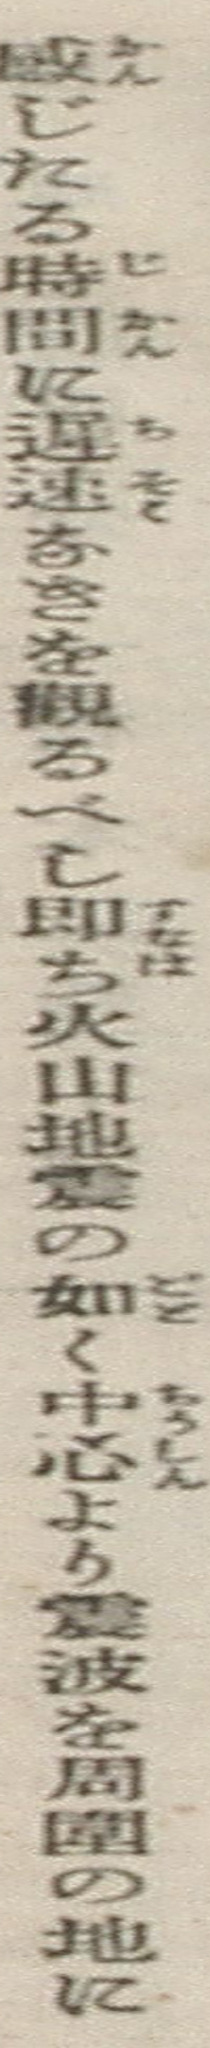感じたる時間に遅速なきを観るべし即ち火山地震の如く中心より震波を周囲の地に
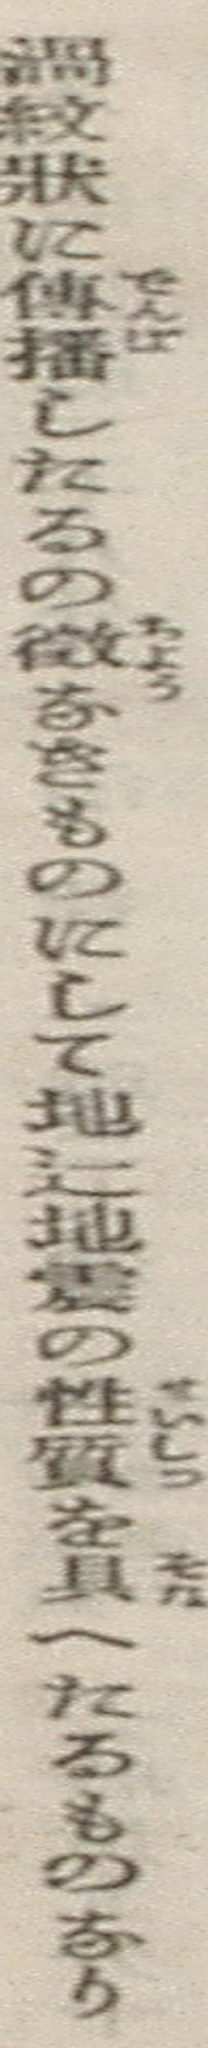渦紋状に伝播したるの徴なきものにして地辷地震の性質を具へたるものなり
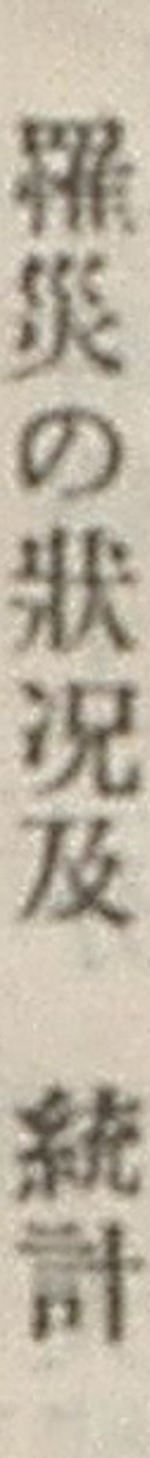罹災の状況及統計
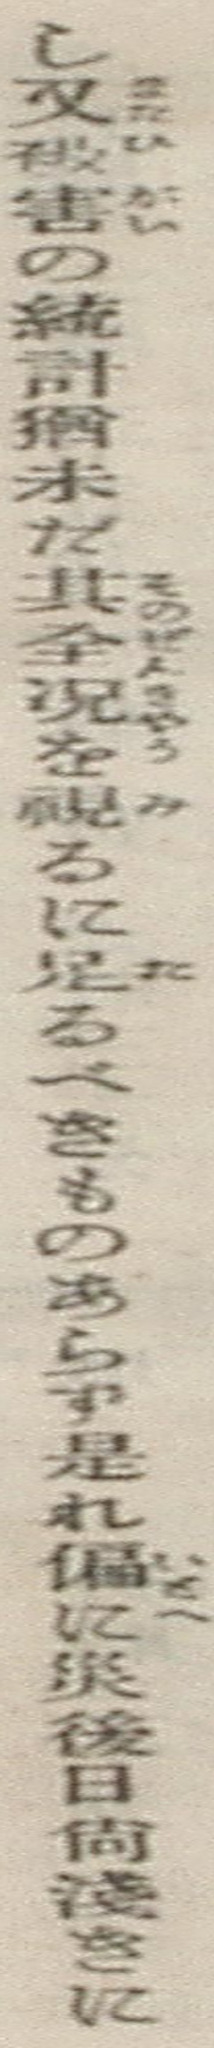し又被害の統計猶未だ其全況を視るに足るべきものあらず是れ偏に災後日尚浅きに
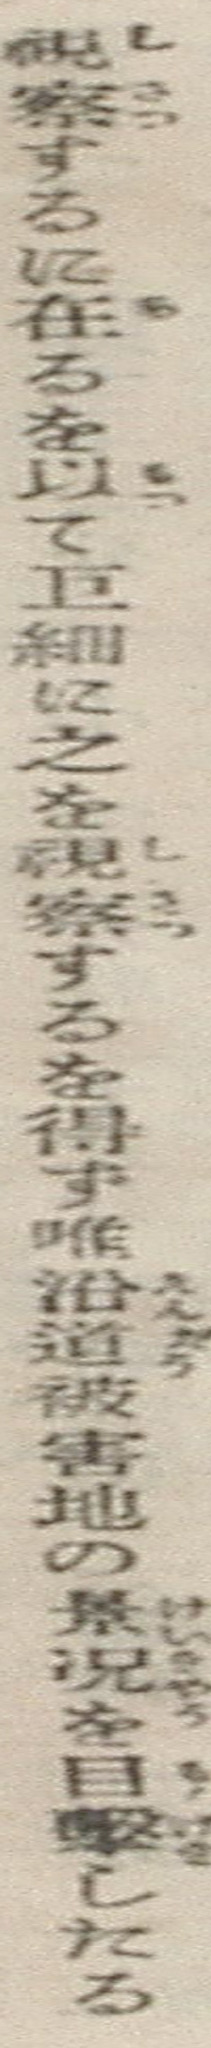視察するに在るを以て巨細に之を視察するを得ず唯沿道えんだう被害地の景況を目撃したる
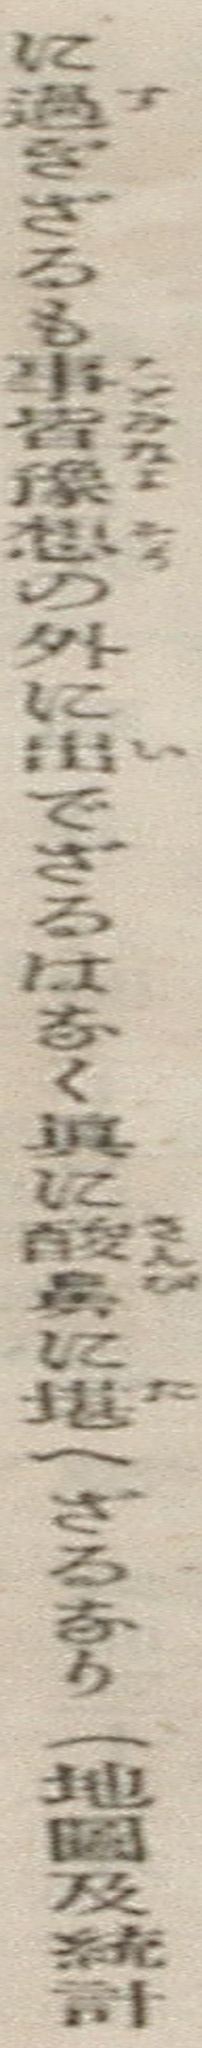に過ぎざるも事皆予想の外に出でざるはなく真に酸鼻に堪へざるなり（地図及統計
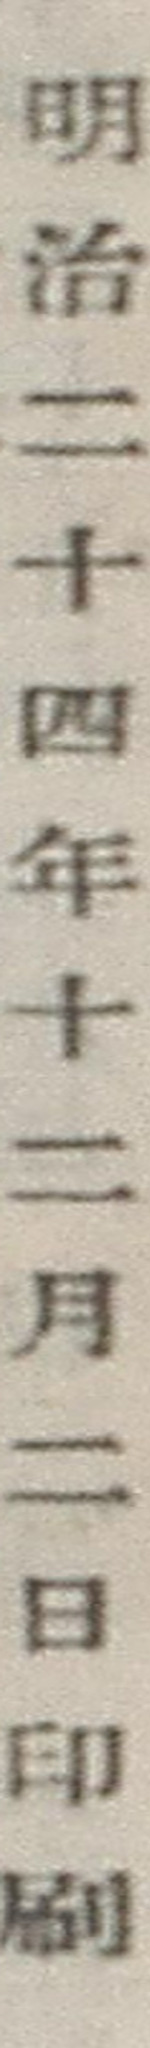明治二十四年十二月二日印刷
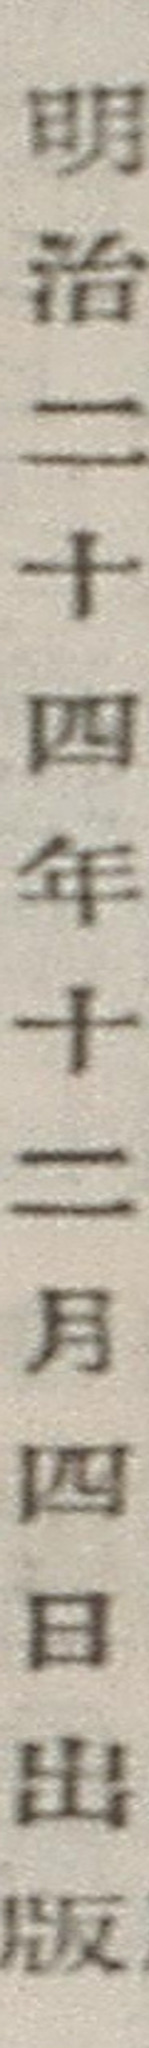明治二十四年十二月四日出版
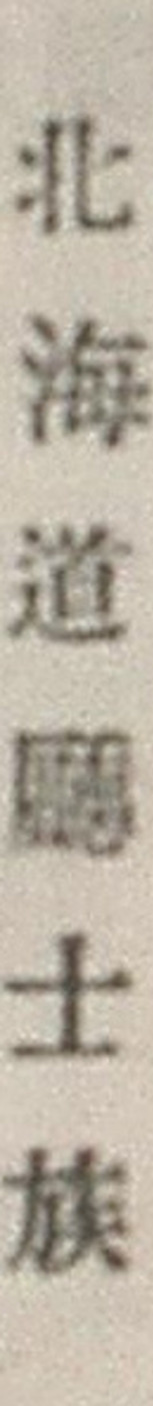北海道庁士族
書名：愛知岐阜福井三県　大地震見聞録（内題）
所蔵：東京大学地震研究所図書室 Earthquake Research Institute Library, The University of Tokyo, JAPAN
